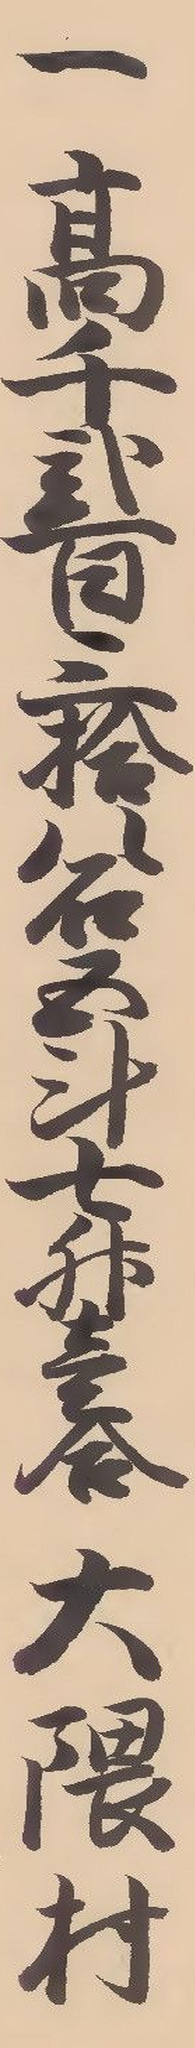一高千弐百三拾八石五斗七升壱合大隈村

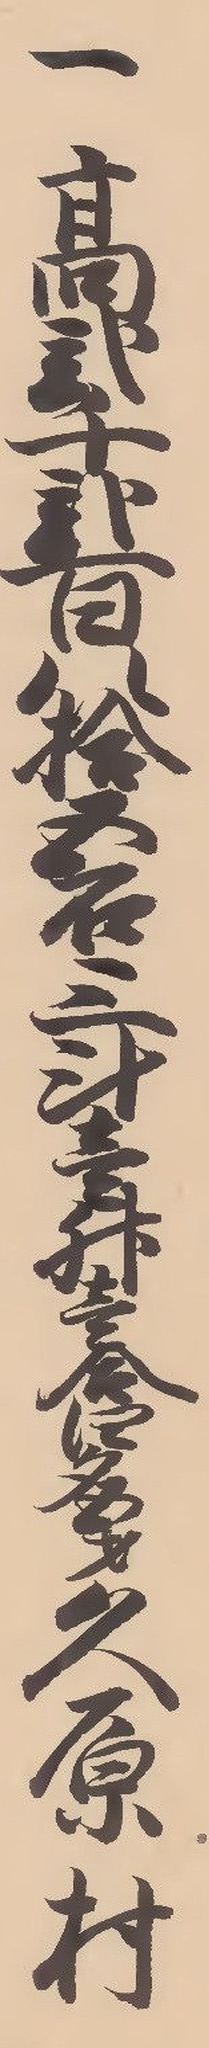一高弐千弐百八拾五石三斗壱升壱合四勺五才久原村
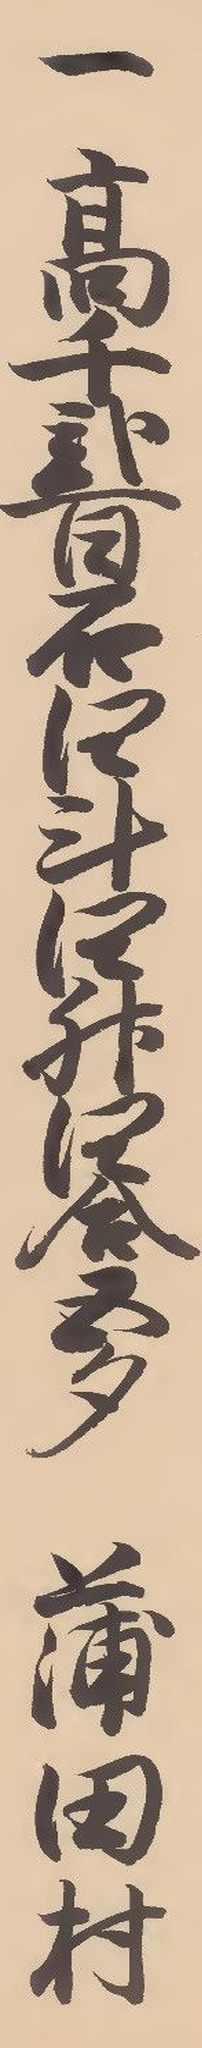一高千弐百石四斗四升四合五勺蒲田村
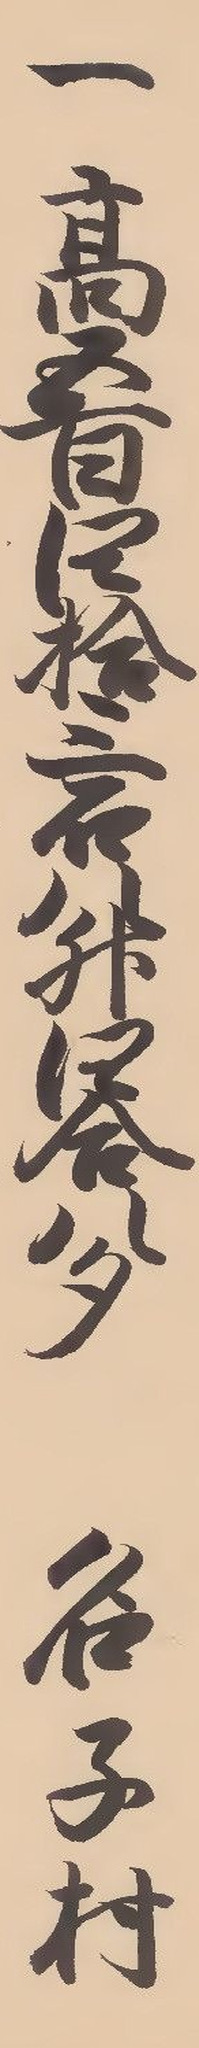一高五百四拾三石八升四合八勺名子村
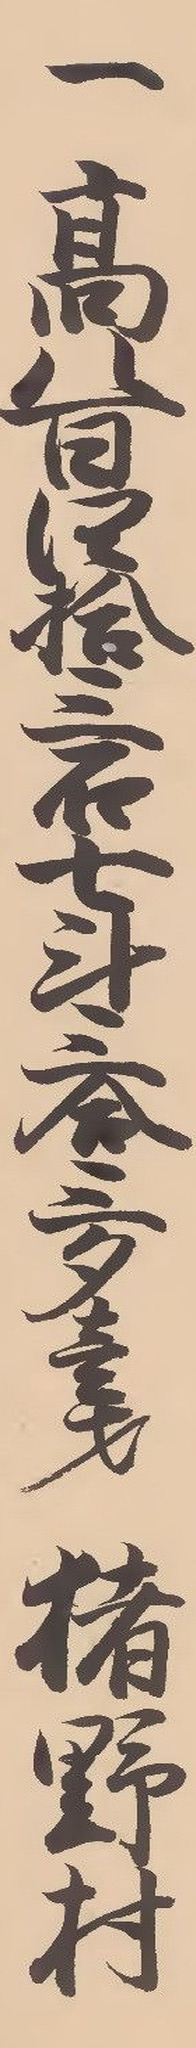一高八百四拾三石七斗三合三勺壱才猪野村
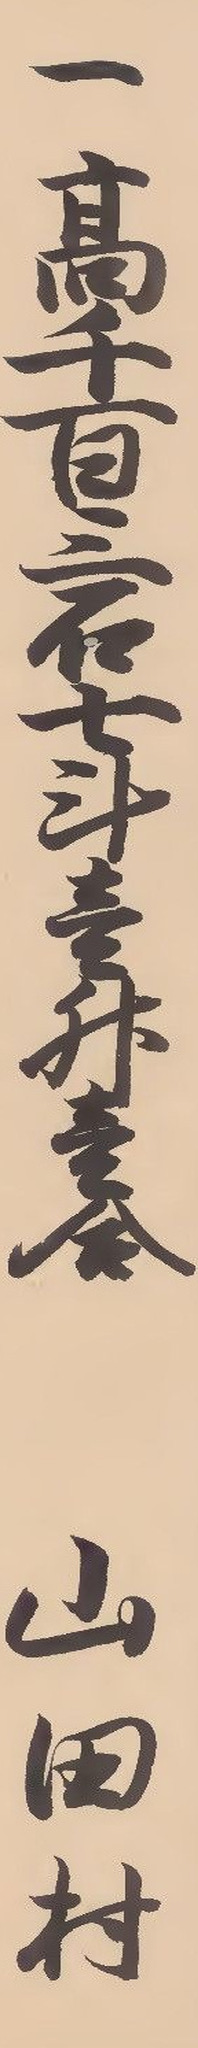一高千百三石七斗壱升壱合山田村
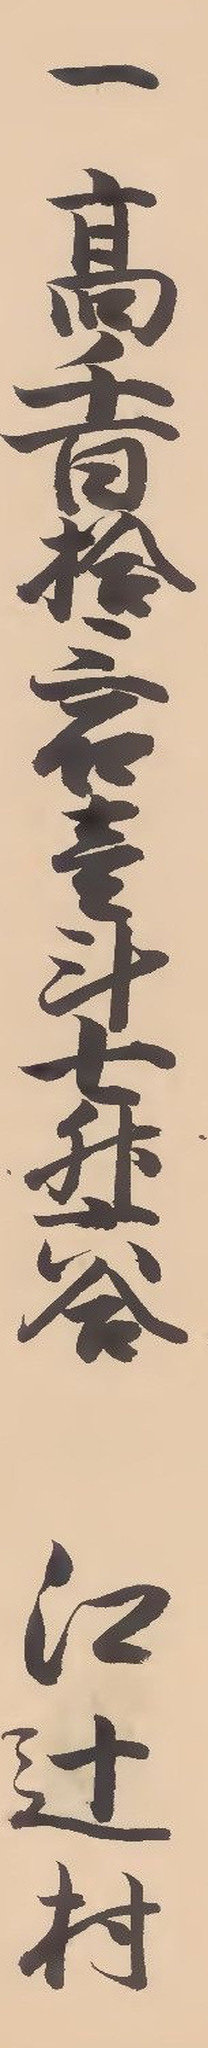一高千百拾三石壱斗七升六合江辻村

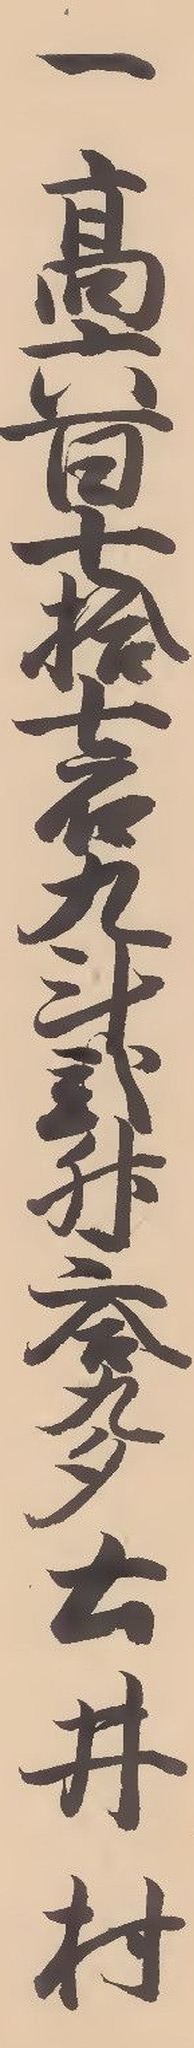一高六百七拾七石九斗弐升三合九勺土井村
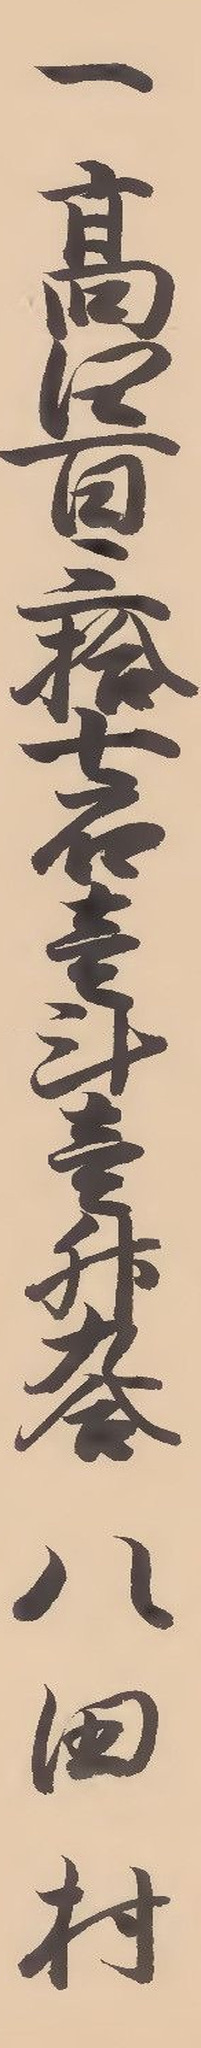一高四百三拾七石壱斗壱升九合八田村
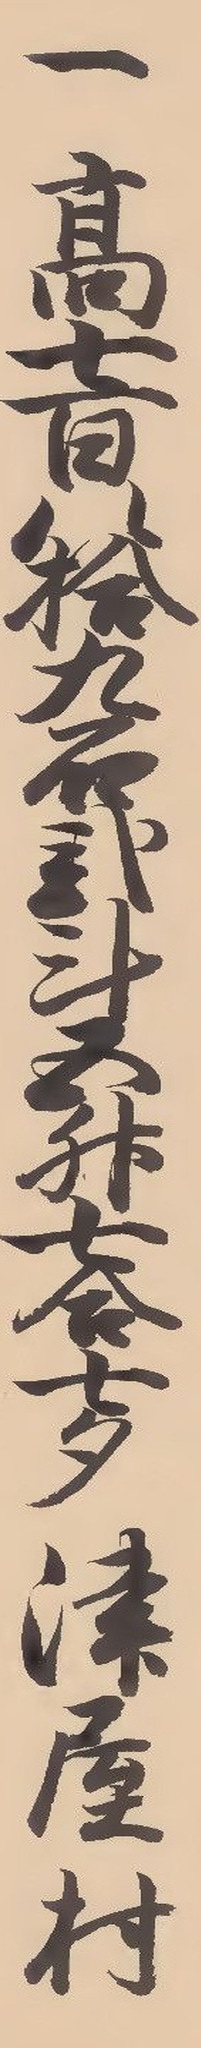一高七百八拾九石弐斗五升七合七勺津屋村
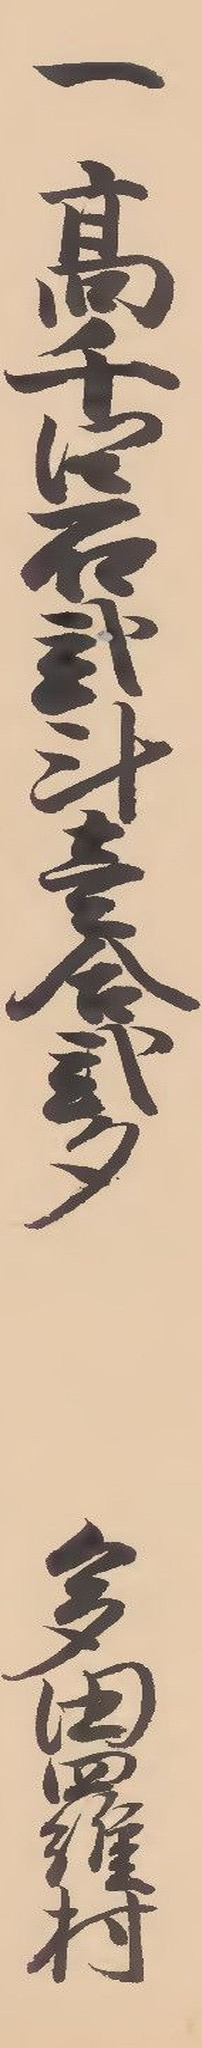一高千四石弐斗壱合弐勺多田羅村
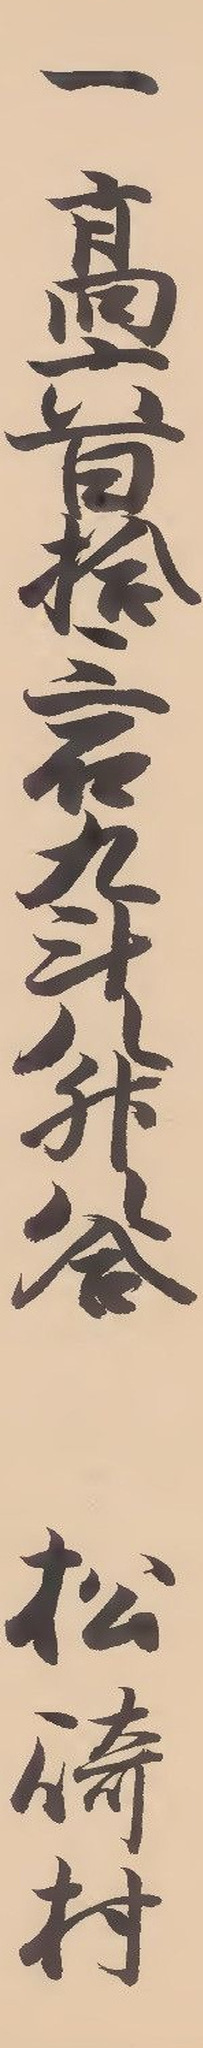一高六百拾三石九斗八升八合松崎村
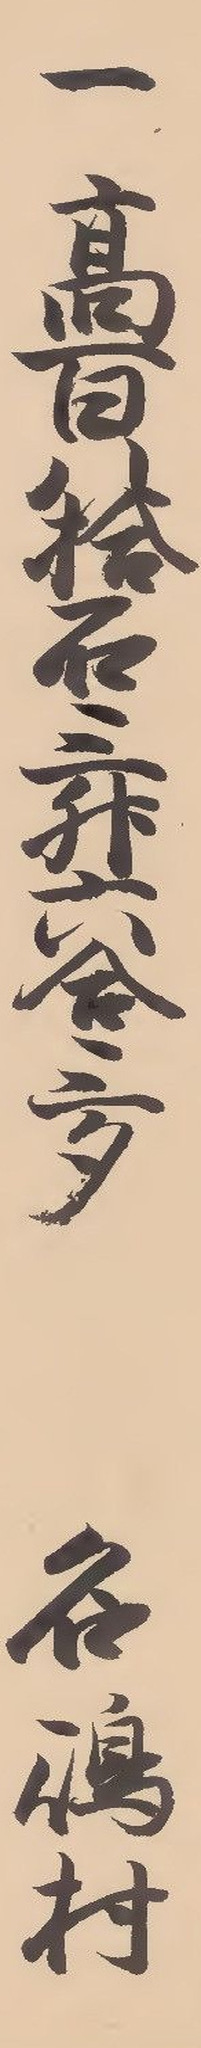一高百八拾石三升六合三勺名島村
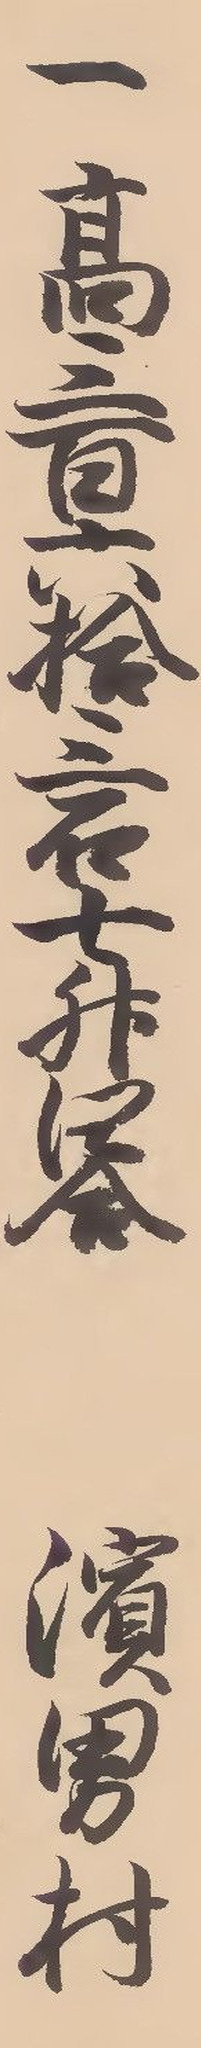一高三百六拾三石七升四合浜男村

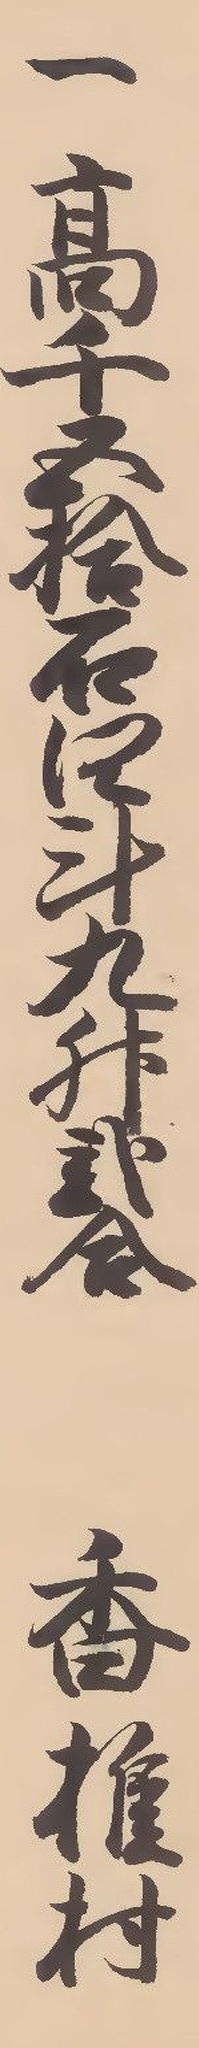一高千五拾石四斗九升弐合香椎村
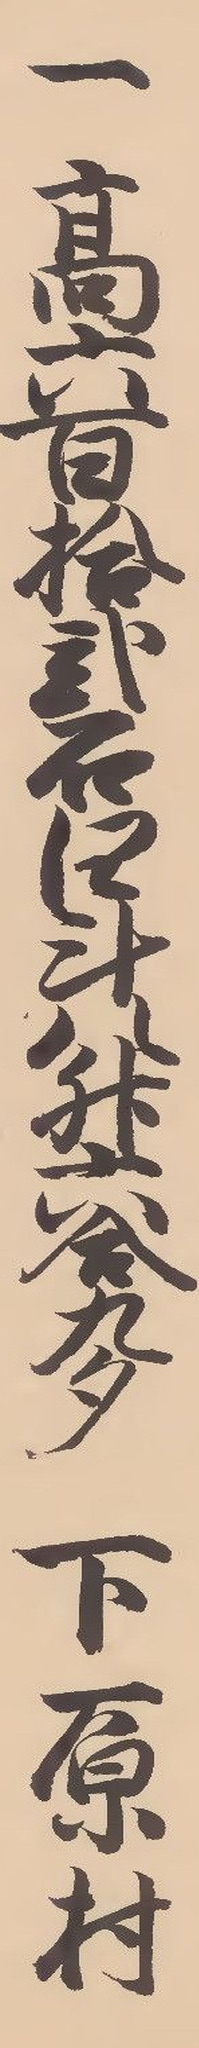一高六百拾弐石四斗八升六合九勺下原村
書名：筑前国郷帳
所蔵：国立公文書館 National Archives of Japan
